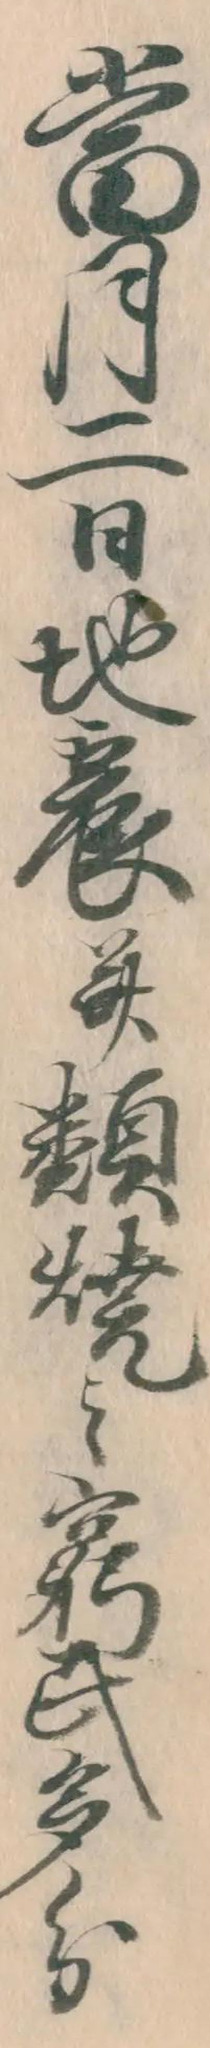当月二日地震并類焼之窮民多分
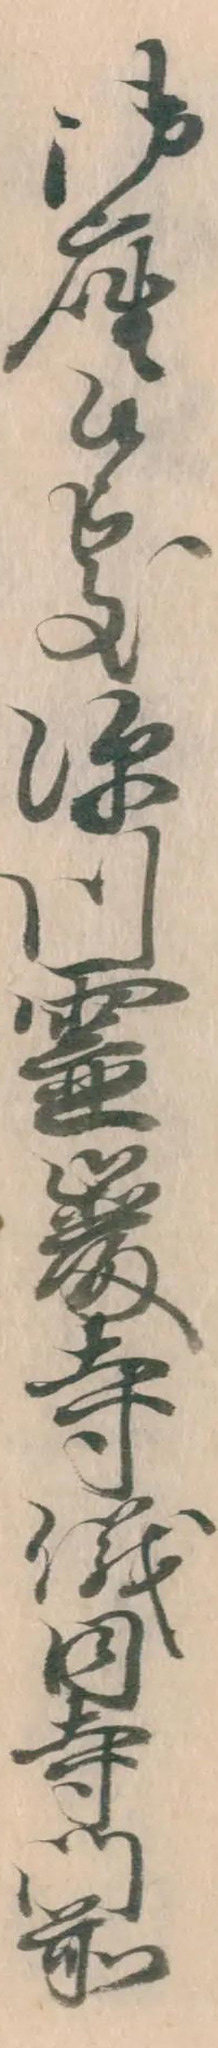御座候処深川霊巌寺儀内寺門前
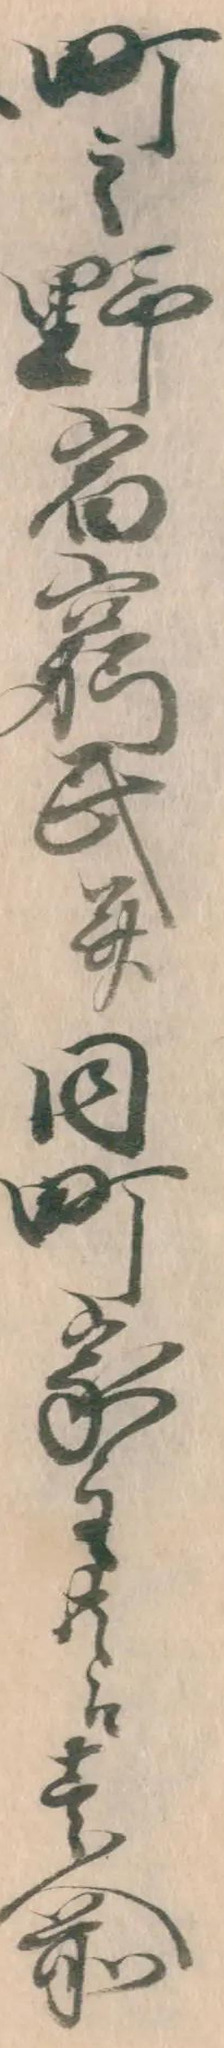町之野宿窮民并同町家主共え壱人前
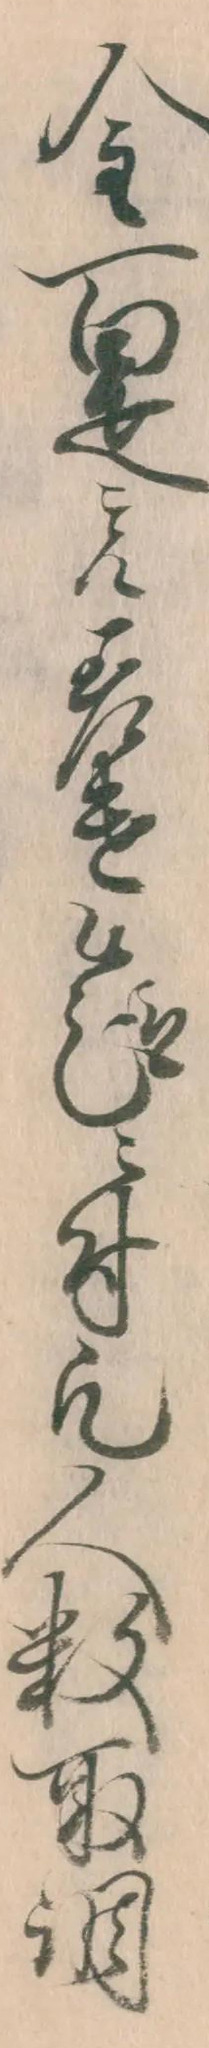金百疋宛差遣候趣ニ付凡人数取調
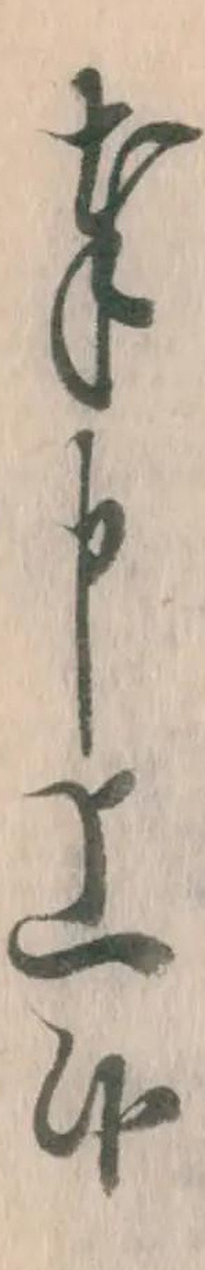奉申上候
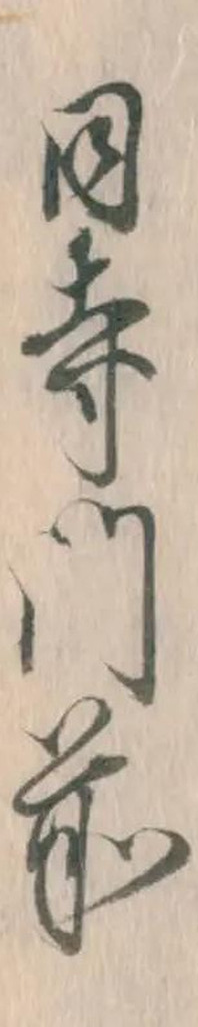同寺門前
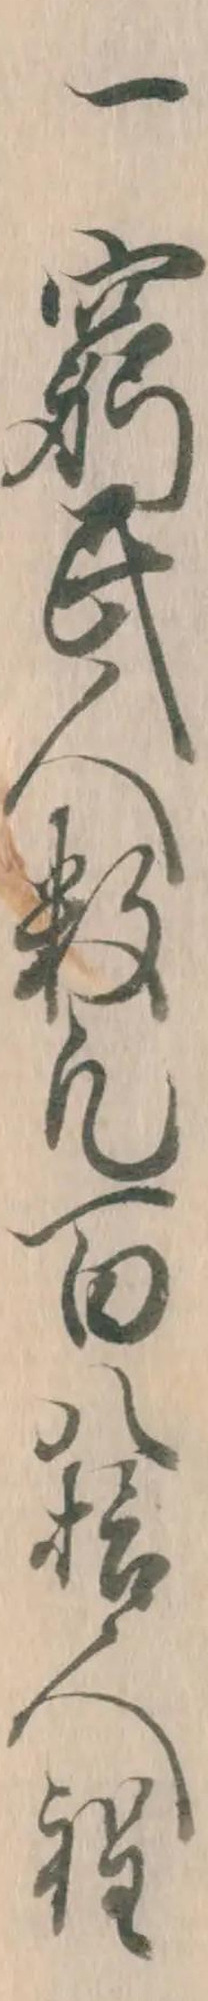一窮民人数凡百八拾人程
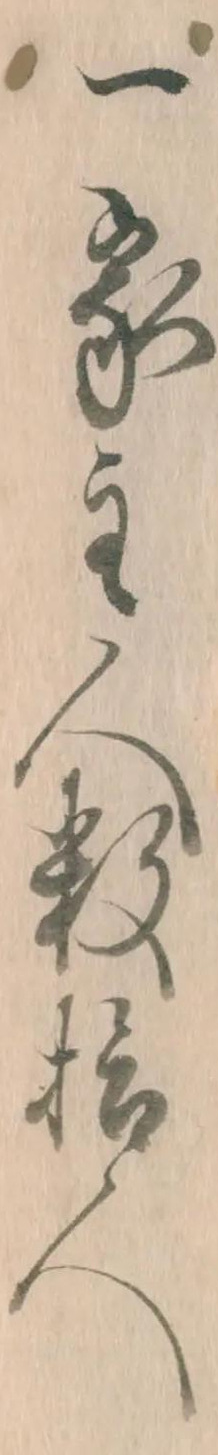一家主人数拾人
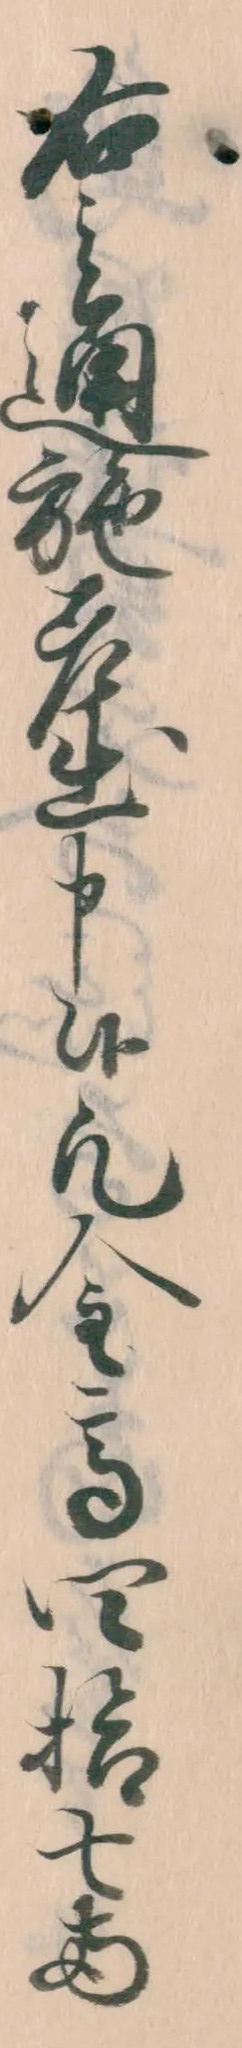右之通施差出申候凡金高四拾七両
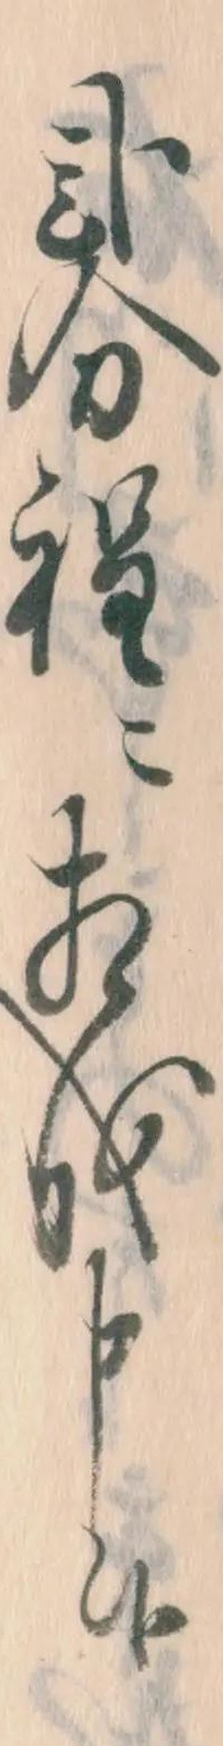弐分程ニ相成申候
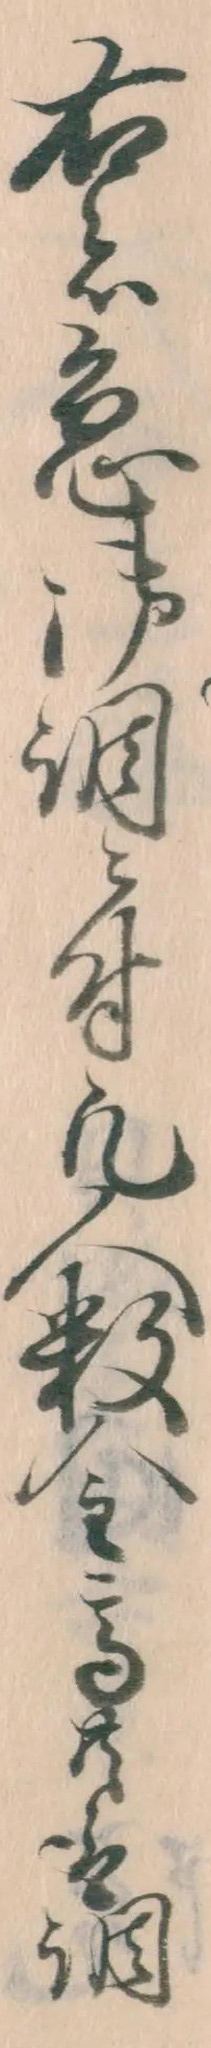右は急御調ニ付凡人数金高共取調
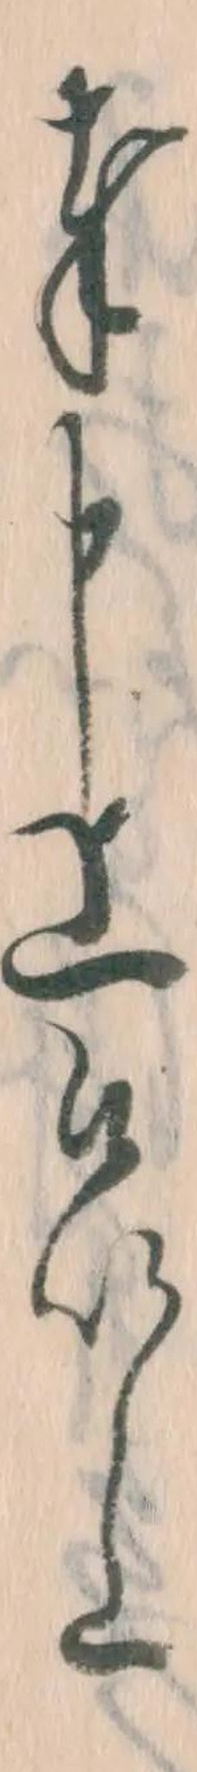奉申上候以上
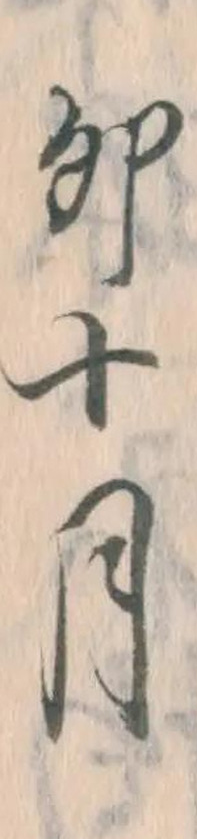卯十月
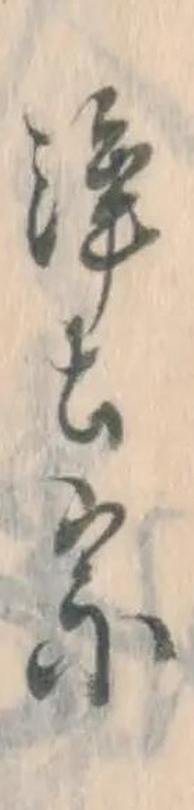浄土宗

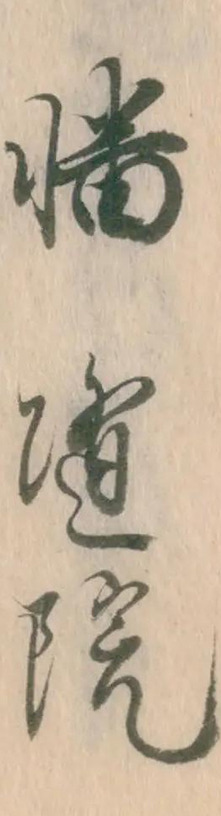幡随院
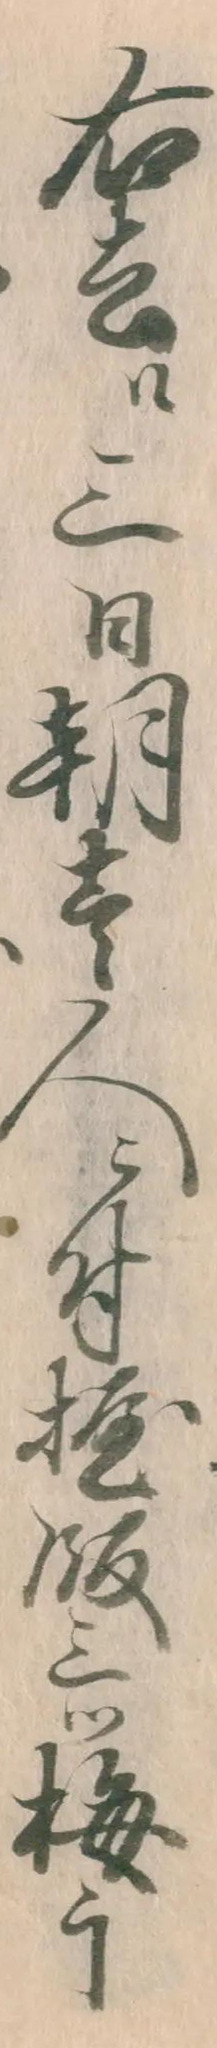右去ル三日朝壱人ニ付握飯三ツ梅干
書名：武家方并寺院等ニテ施差出候一件
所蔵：国立国会図書館 National Diet Library, JAPAN
